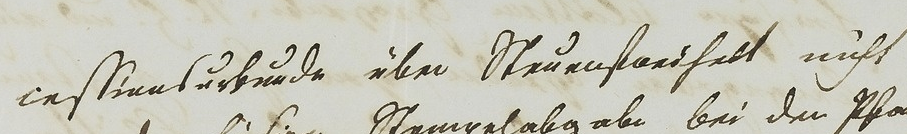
cessionsurkunde über Steuerfreiheit nicht
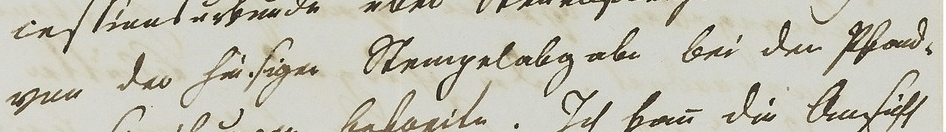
von der hiesigen Stempelabgabe bei den Pfand-
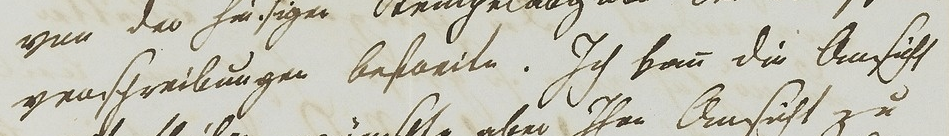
verschreibungen befreite. Ich kann die Ansicht
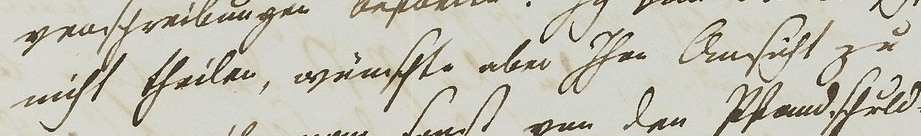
nicht theilen, wünschte aber Ihre Ansicht zu
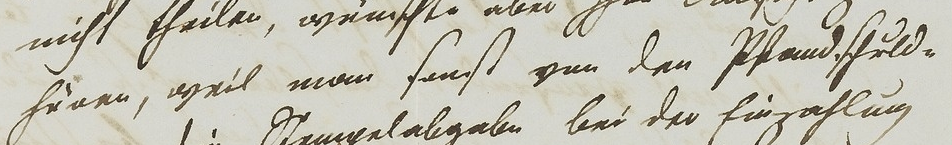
hören, weil man sonst von den Pfandschuld-
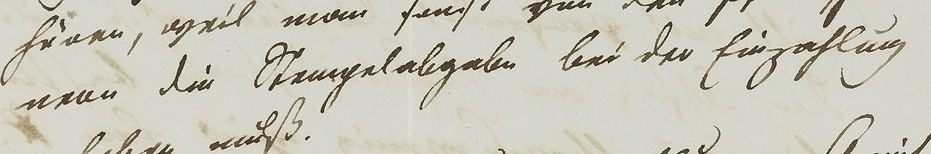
nern die Stempelabgabe bei der Einzahlung
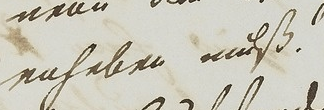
erheben muß.
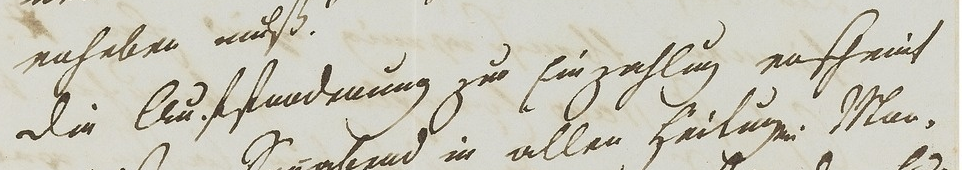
Die Aufforderung zur Einzahlung erscheint
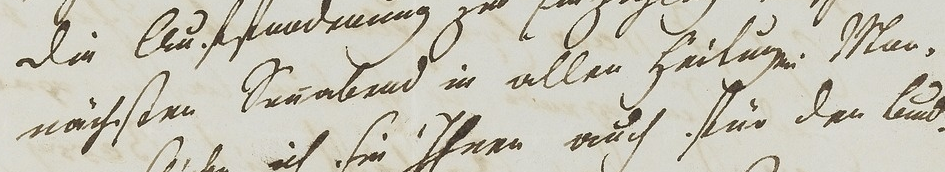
nächsten Sonnabend in allen Zeitungen. Mor-
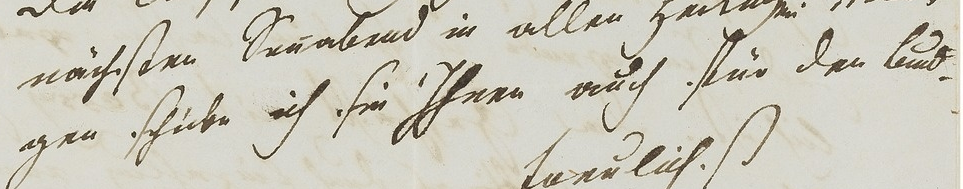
gen schicke ich sie Ihnen auch für den Bund.
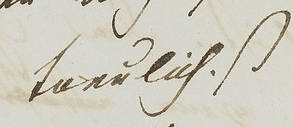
treulichst
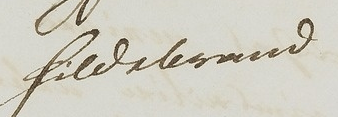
Hildebrand
